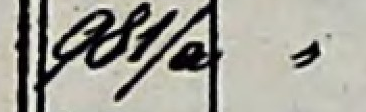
981/a „
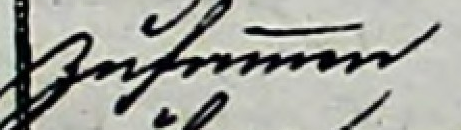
Zusammen
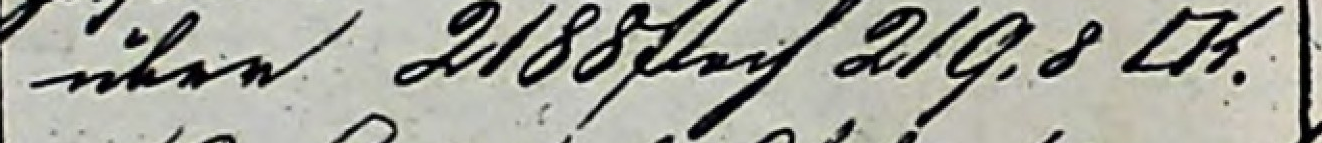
über 2188b stech 219,8 Ck.
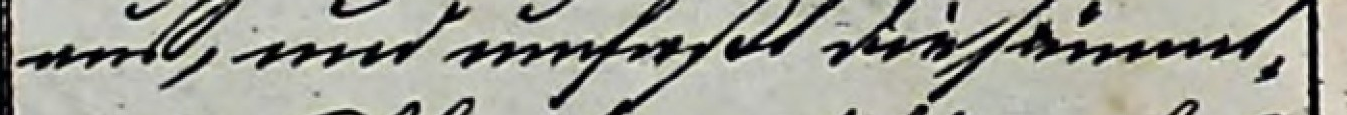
aus, und umfastl die sämmt„
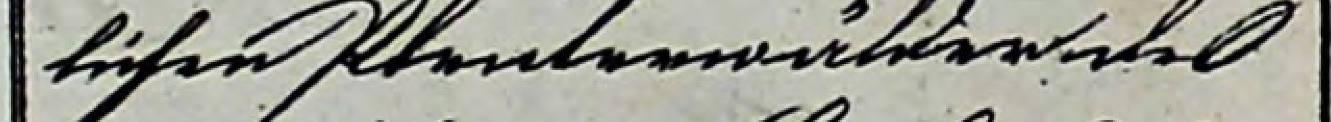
lichen Plenterwälder des
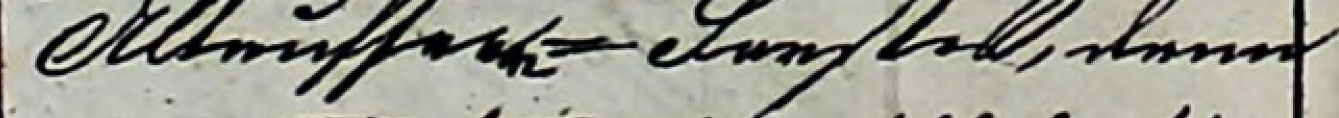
Altaussee? = Forstes, dann
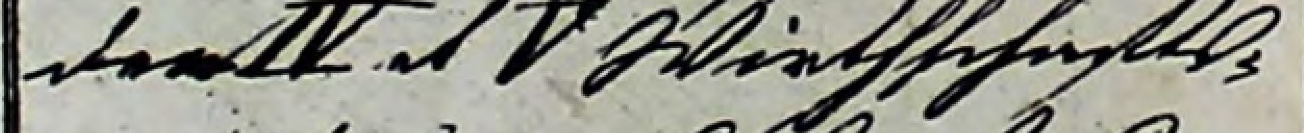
den IV et V Wirthschafts„
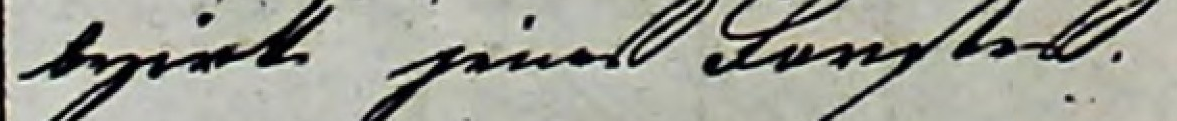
bezirk jeines Forstes.
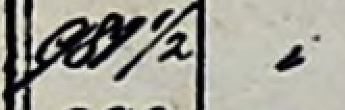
989 1/2 „
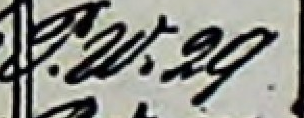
P.W. 29
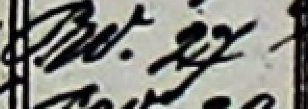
P.W. 27
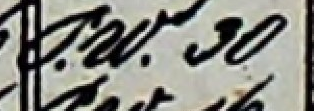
P.W. 30
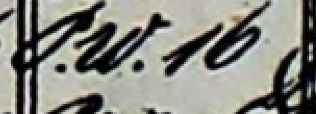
P.W. 16
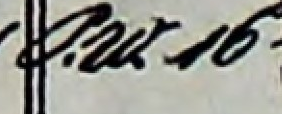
P.W. 16
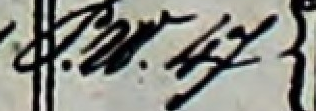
P.W. 47
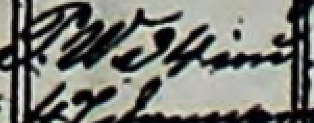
P.W. 34 und
